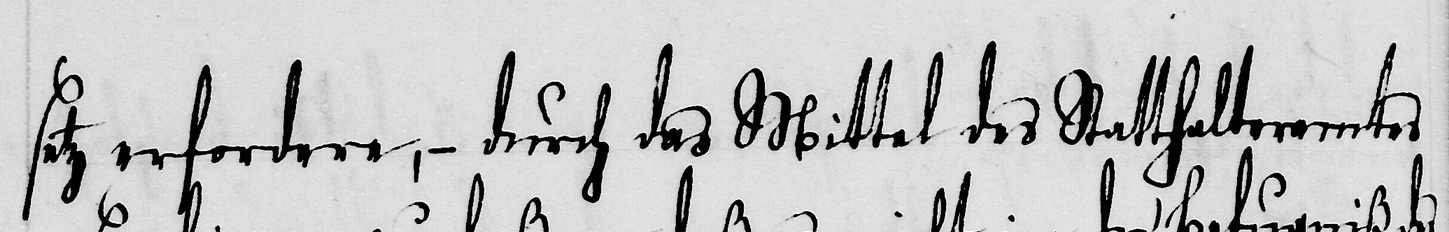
setz erfordere, – durch das Mittel des Statthalteramtes
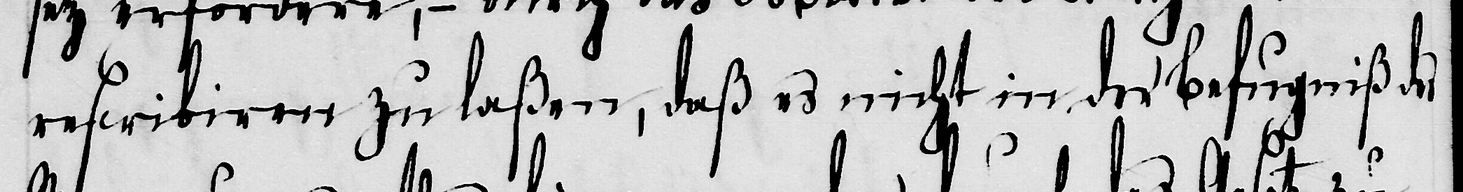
rescribiren zu laßen, daß es nicht in der Befugniß des
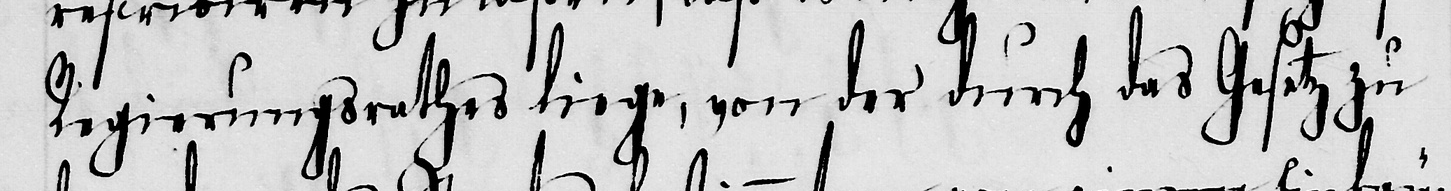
Regierungsrathes liege, von der durch das Gesetz zu
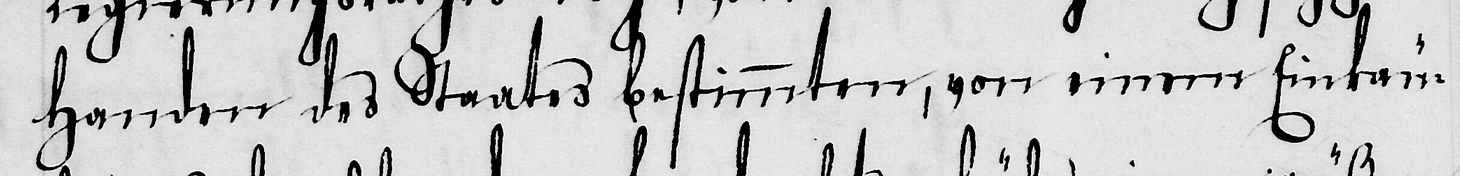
Handen des Staates bestimmten, von einem Einkäu¬
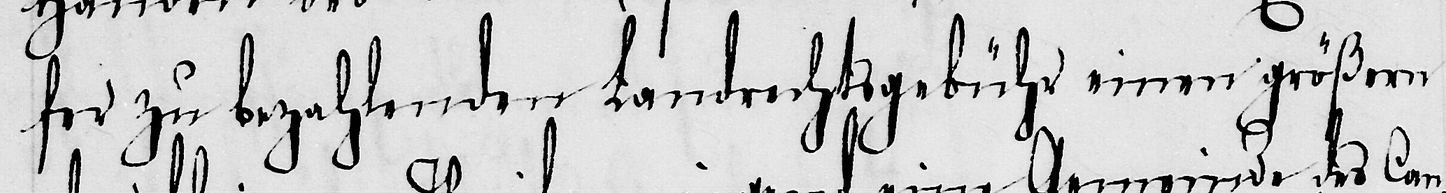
fer zu bezahlenden Landrechtsgebühr einen größern
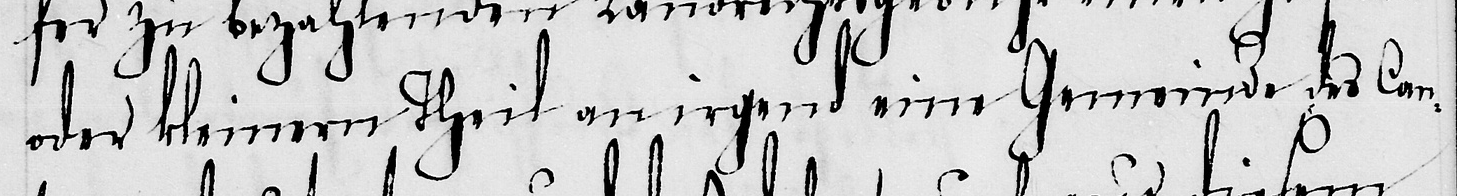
oder kleinern Theil an irgend eine Gemeinde des Can¬
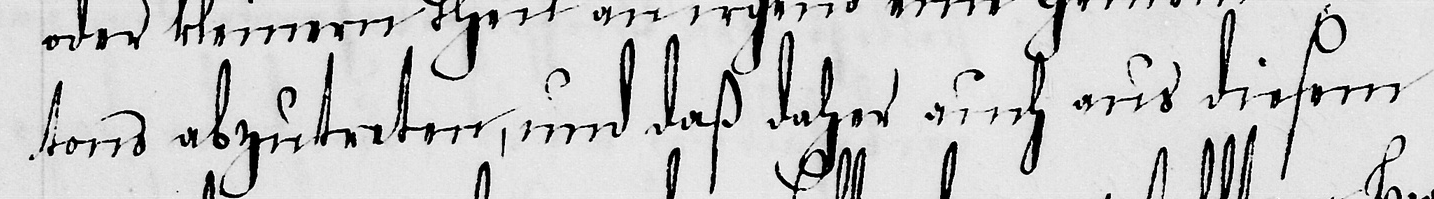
tons abzutreten, und daß daher auch aus diesem
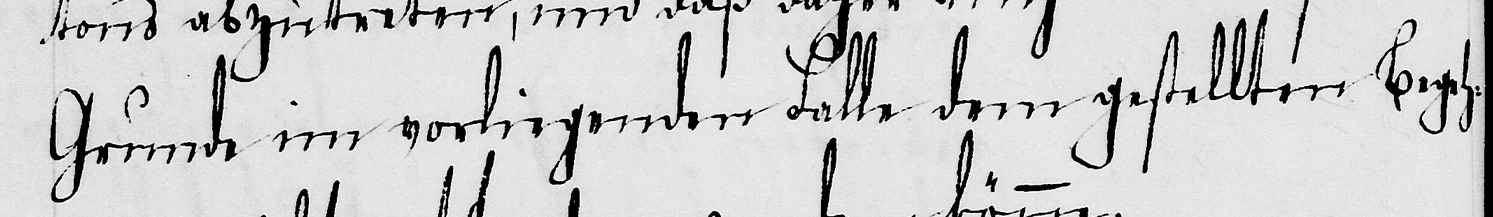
Grunde im vorliegenden Falle dem gestellten Beg¬
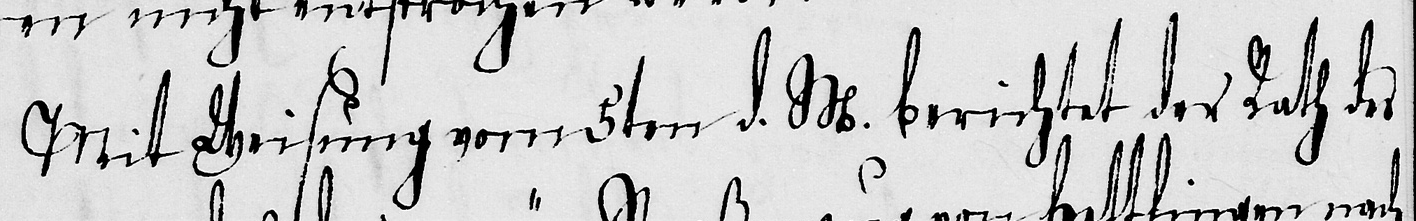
Mit Weisung vom 5ten d. M. berichtet der Rath des
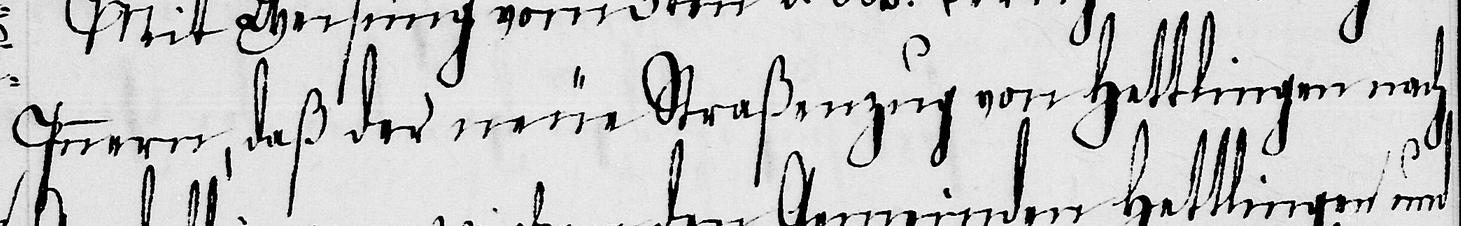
Innern, daß der neue Straßenzug von Hettlingen nach
